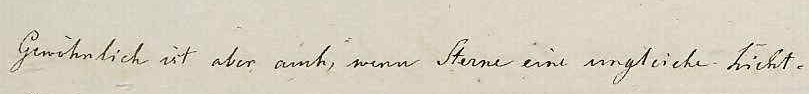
Gewöhnlich ist aber auch, wenn Sterne eine ungleiche Licht-
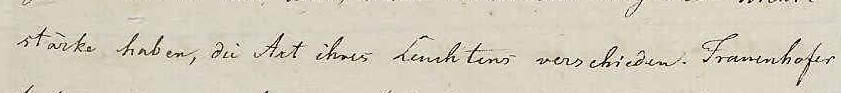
stärke haben, die Art ihres Leuchtens verschieden. Frauenhofer
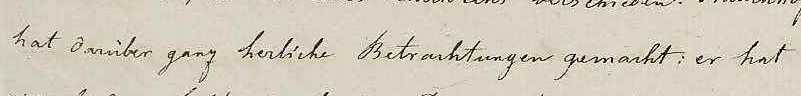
hat darüber ganz herliche Betrachtungen gemacht: er hat
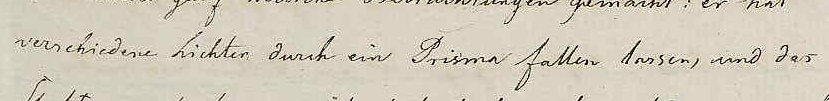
verschiedene Lichter durch ein Prisma fallen lassen, und das
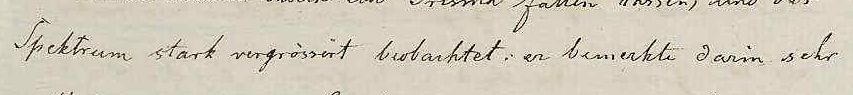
Spektrum stark vergrössert beobachtet: er bemerkte darin sehr
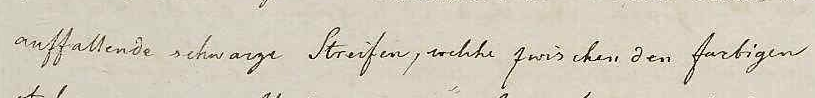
auffallende schwarze Streifen, welche zwischen den farbigen
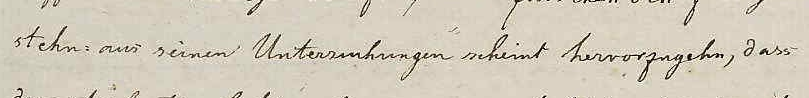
stehn: aus seinen Untersuchungen scheint hervorzugehen, dass
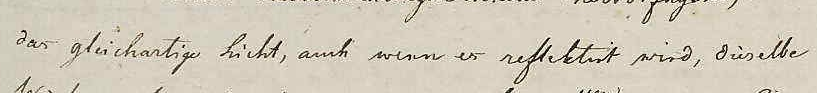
das gleichartige Licht, auch wenn es reflektirt wird, dieselbe
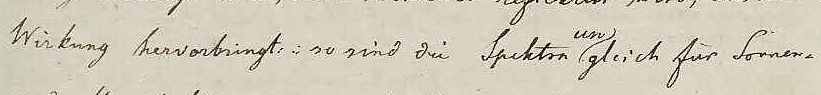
Wirkung hervorbringt: so sind die Spektra ungleich für Sonnen-
